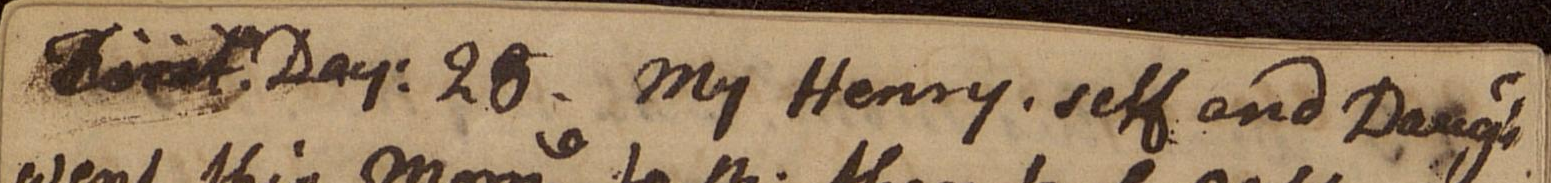First Day: 28. my Henry. self and Daugh^r
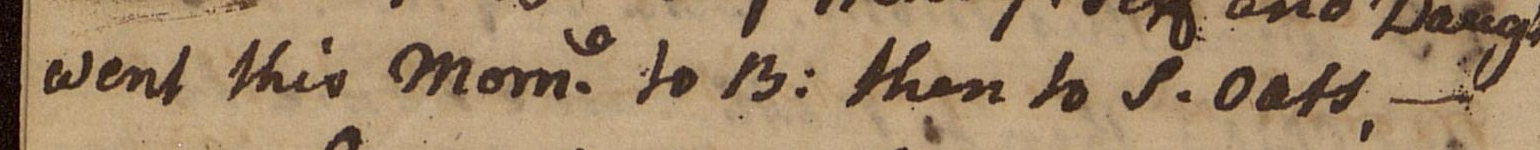went this Morn^g. to B: then to S. 0ats, -
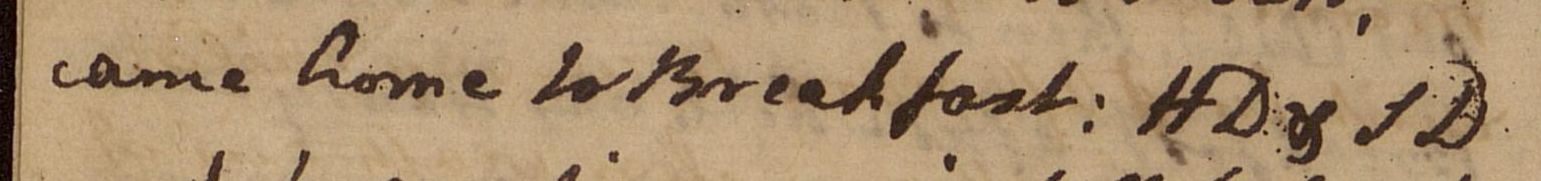came home to Breakfast: HD & SD
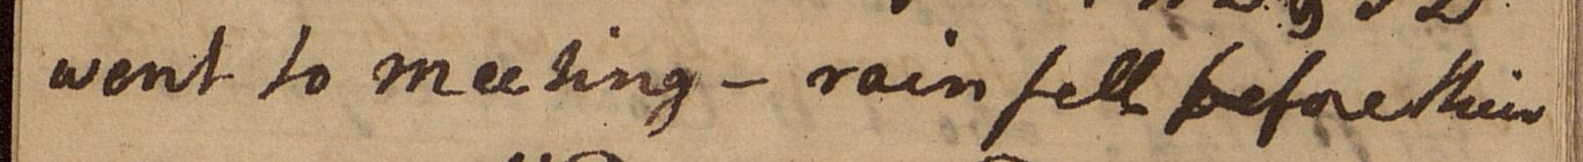went to meeting- rain fell before their
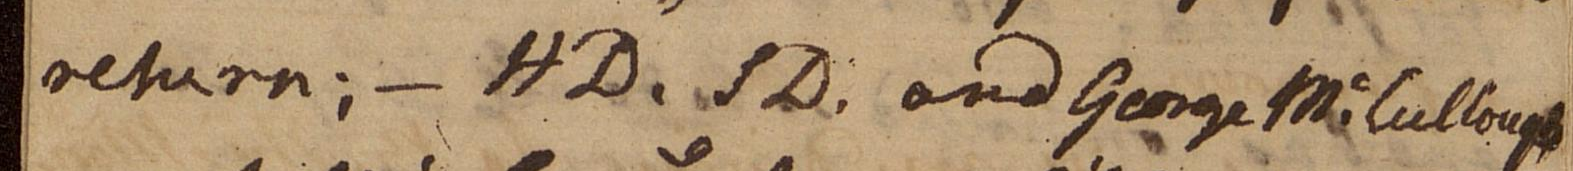return - HD. SD. and George M^c Cullough
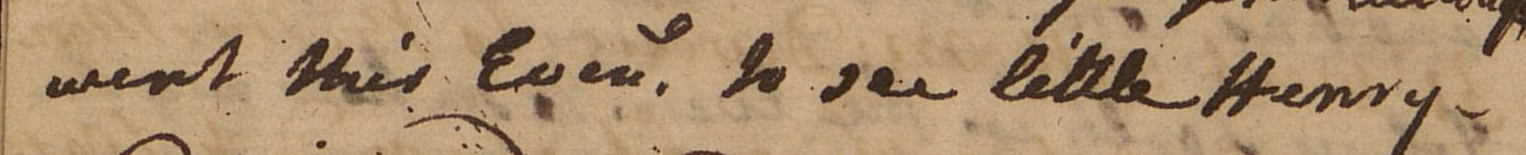went this Even^g. to see little Henry-
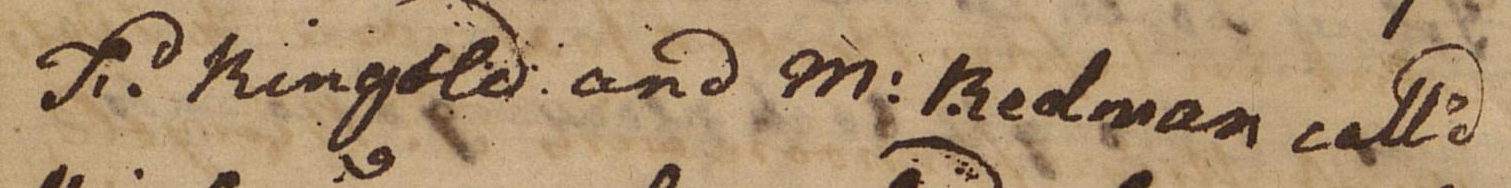Fr^d. Ringold: and M: Redman call'd
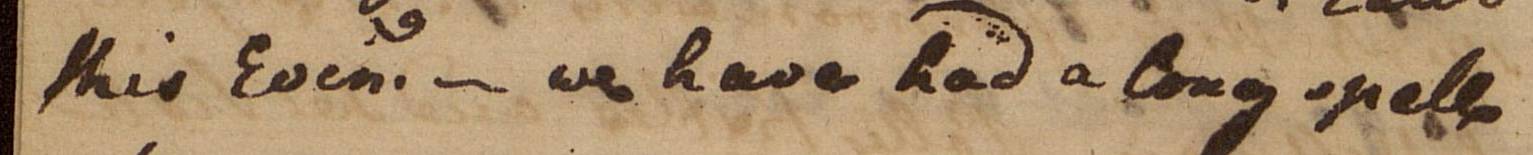this Even^g.- we have had a long spell
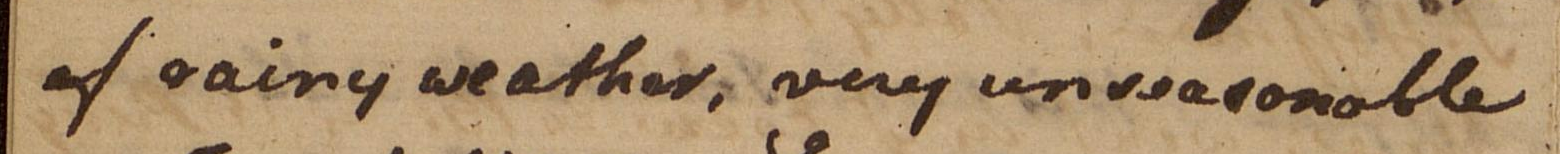of rainy weather, very unseasonable
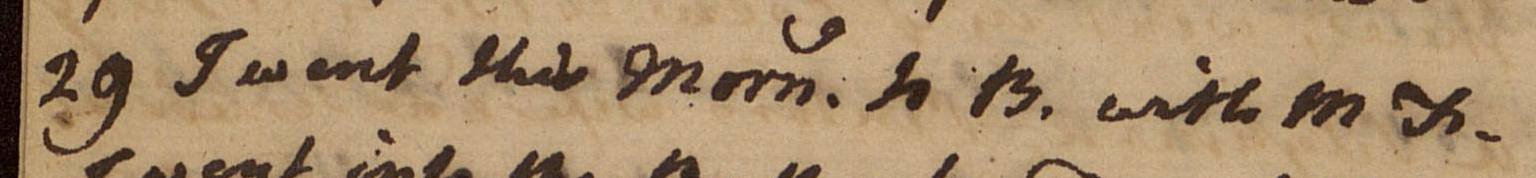29 I went thee morn^g. to B. with MF-
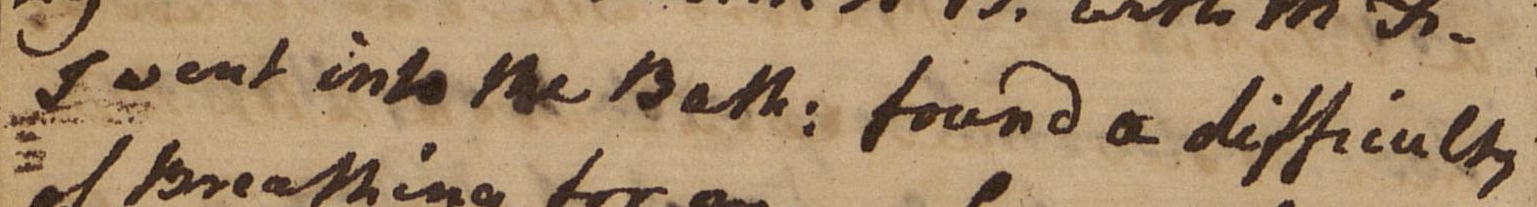I went into the Bath: found a difficulty
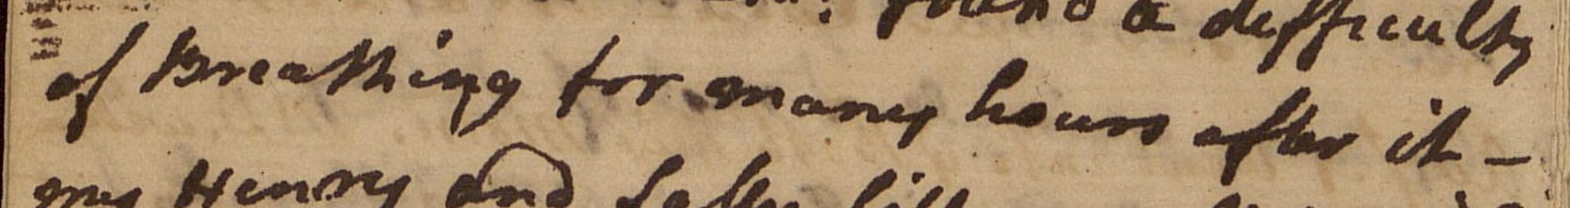of Breathing for many hours after it-
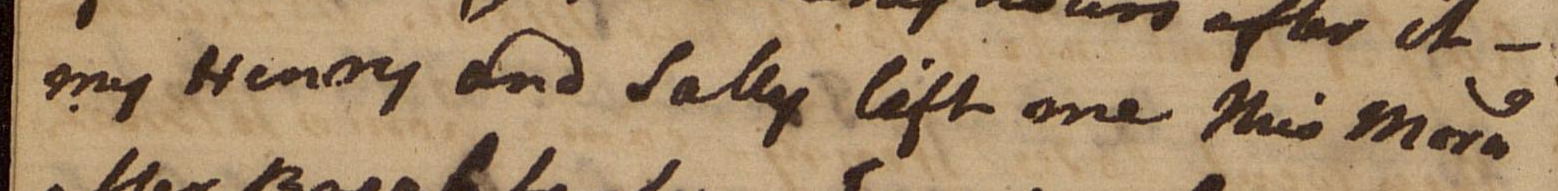my Henry and Sally left me this Morn^g
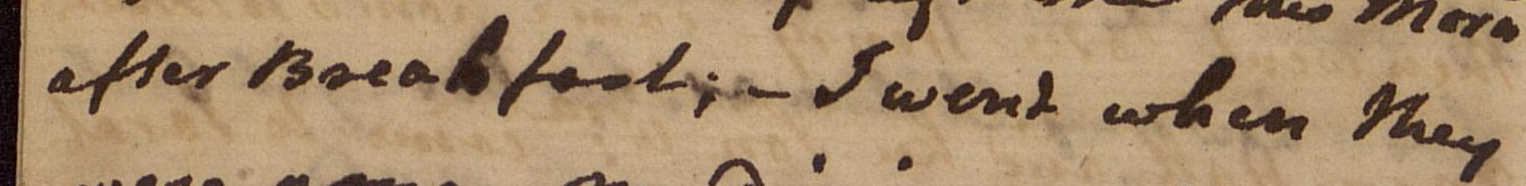after Breakfast;- I went when they
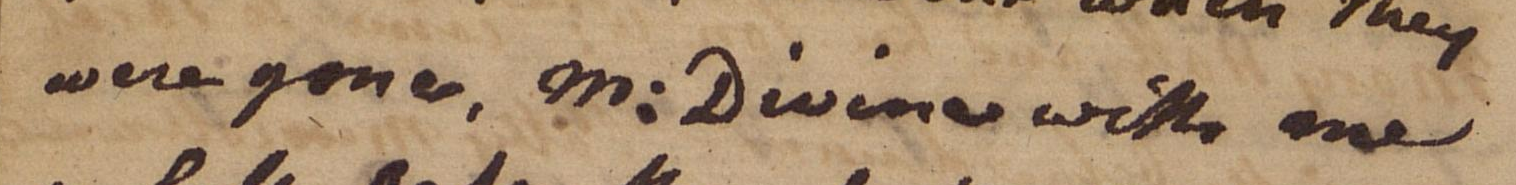were gone, M: Divine with me
